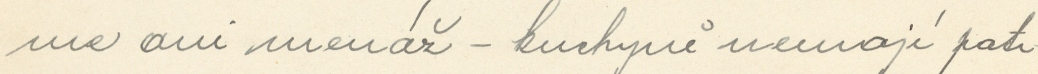me ani menáž - kuchyně nemají patr-
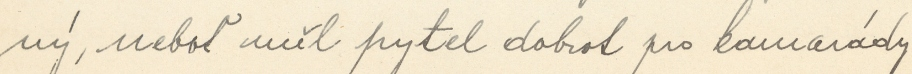ný, neboť měl pytel dobrot pro kamarády
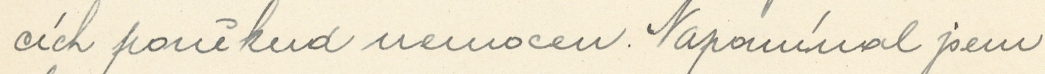cích poněkud nemocen. Napomínal jsem
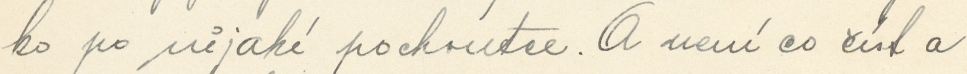ko po nějaké pochoutce. A není co číst a
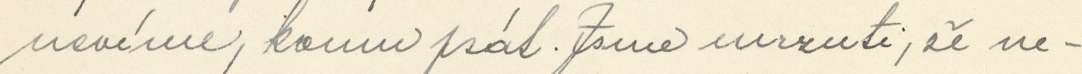nevíme, komu psát. Jsme mrzuti, že ne-
